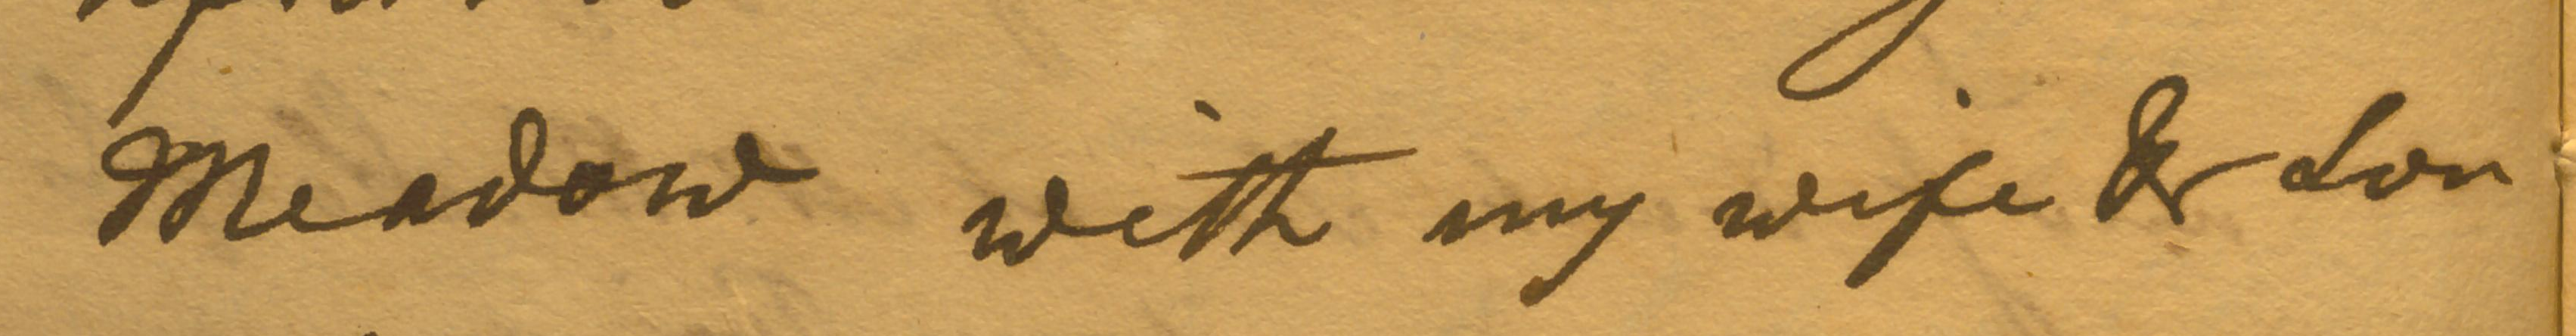Meadow with my wife & son
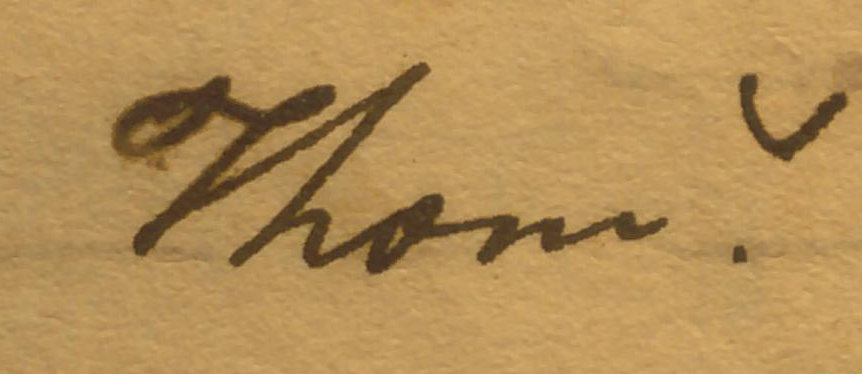Thom^s.
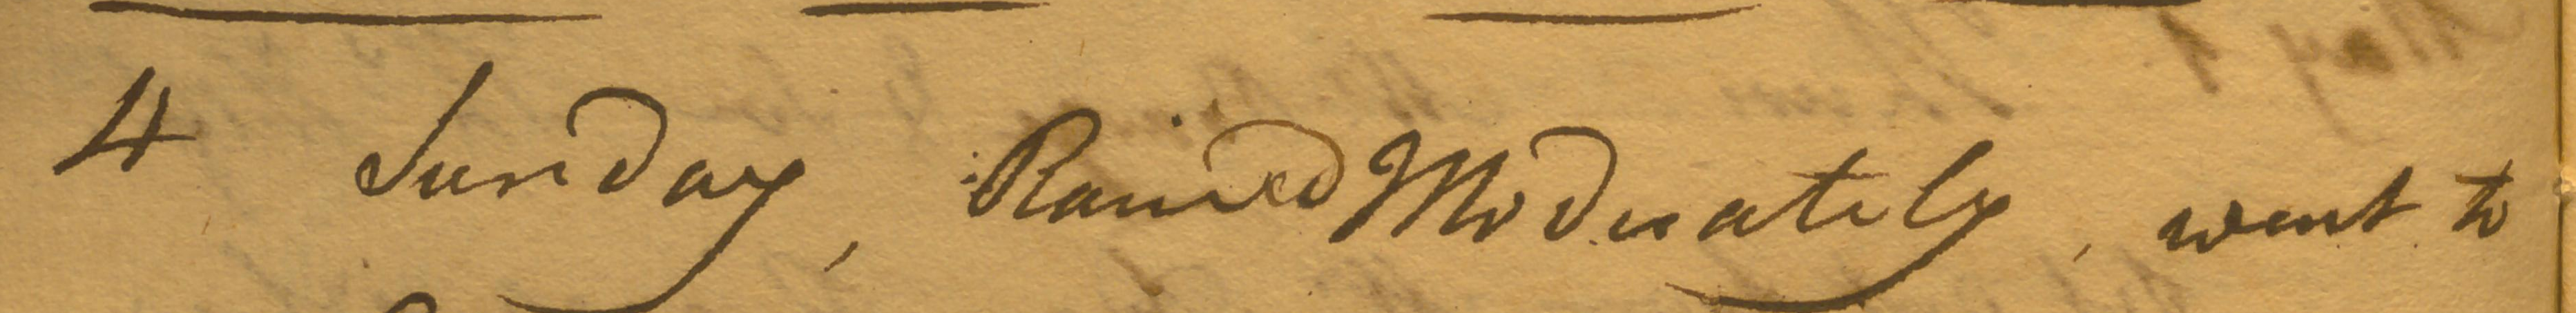4 Sunday Rained Moderately went to
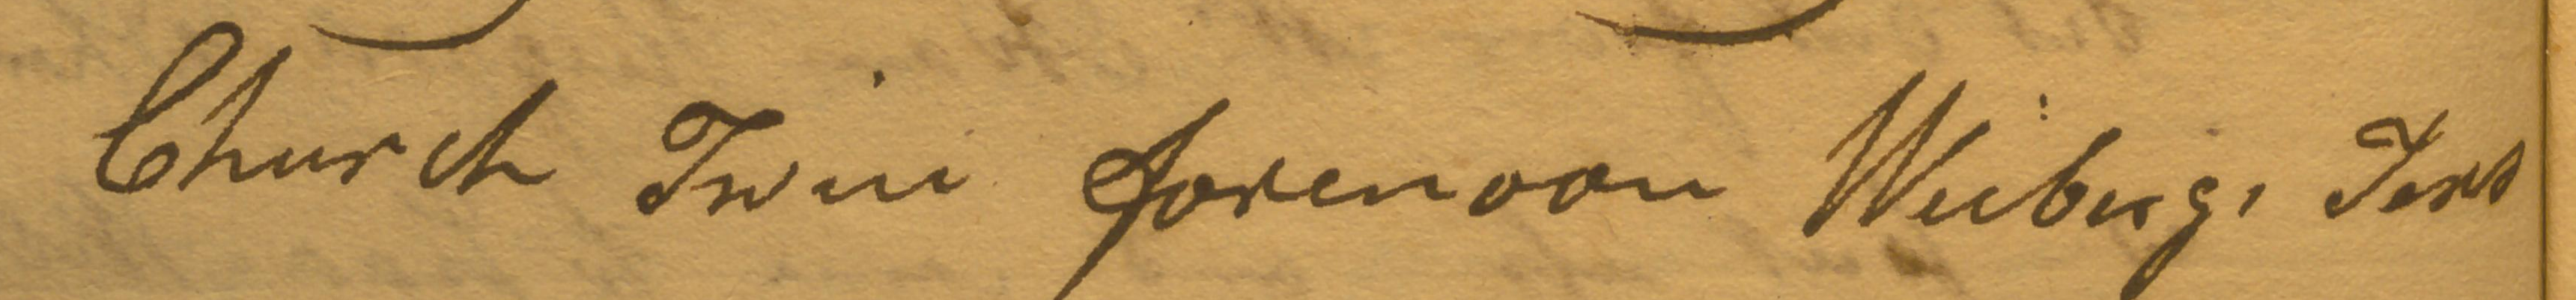Church Twice forenoon Weibergs Text
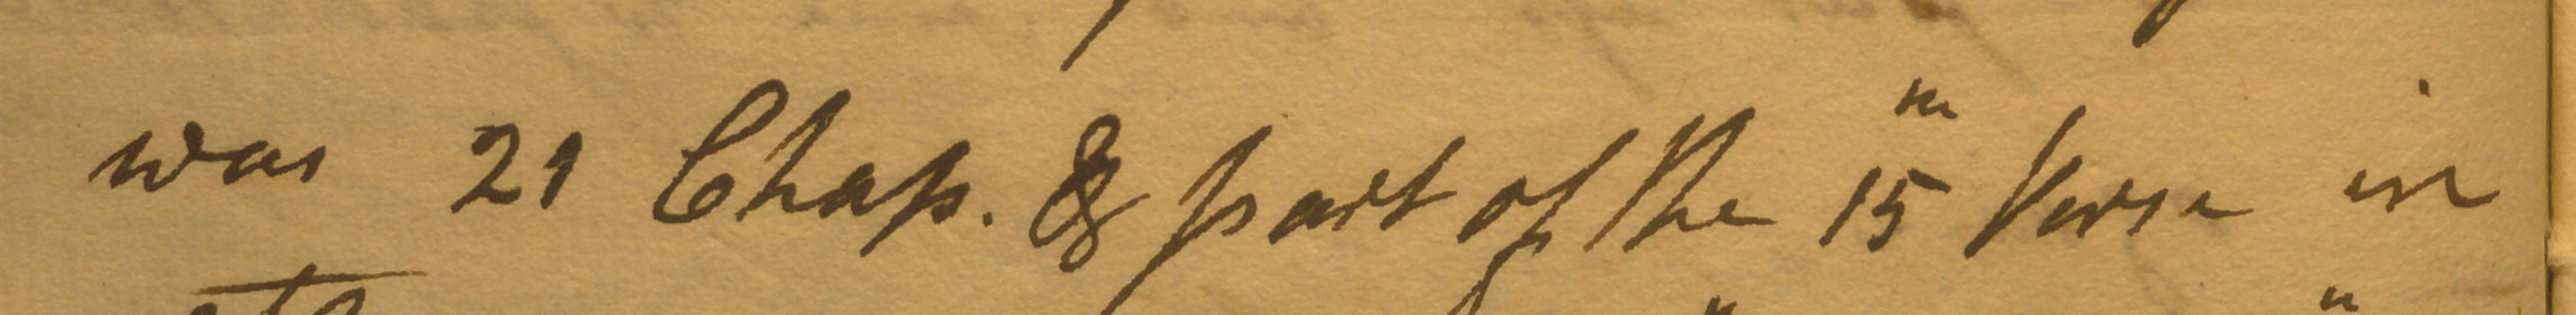was 21 Chap. & part of the 15^th Verse in
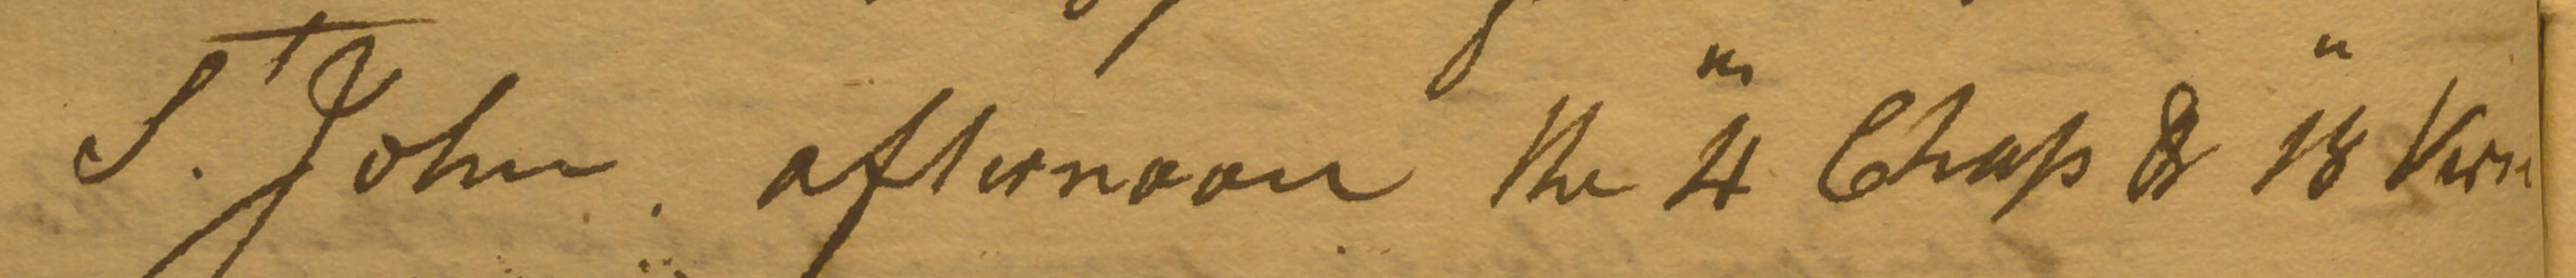S^t. John, afternoon the 4^th Chap & 18^th Verse
